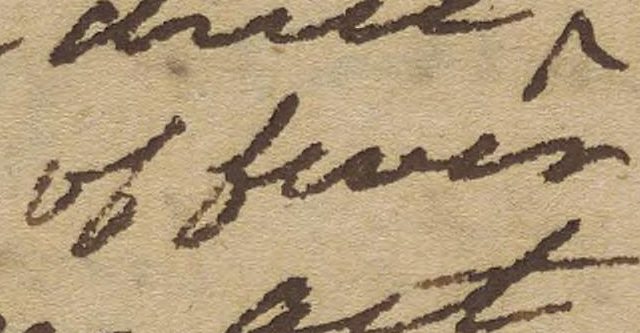of fever
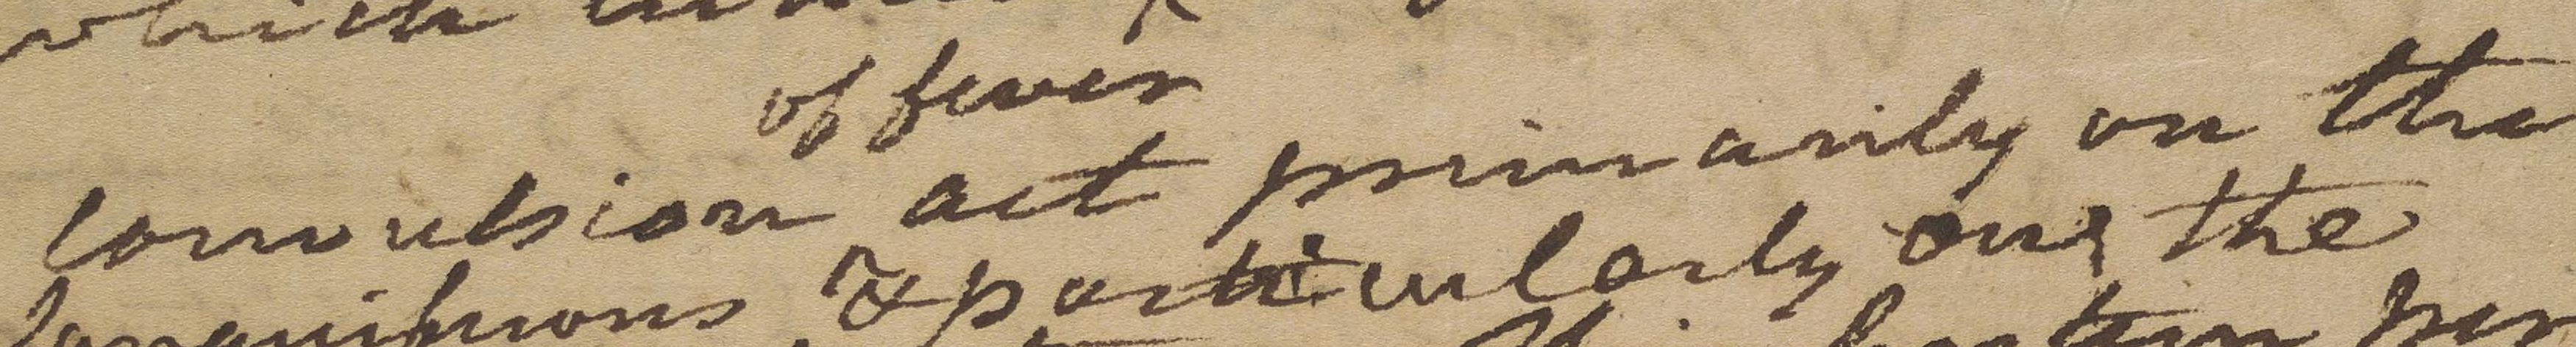convulsion ^ act primarily on the
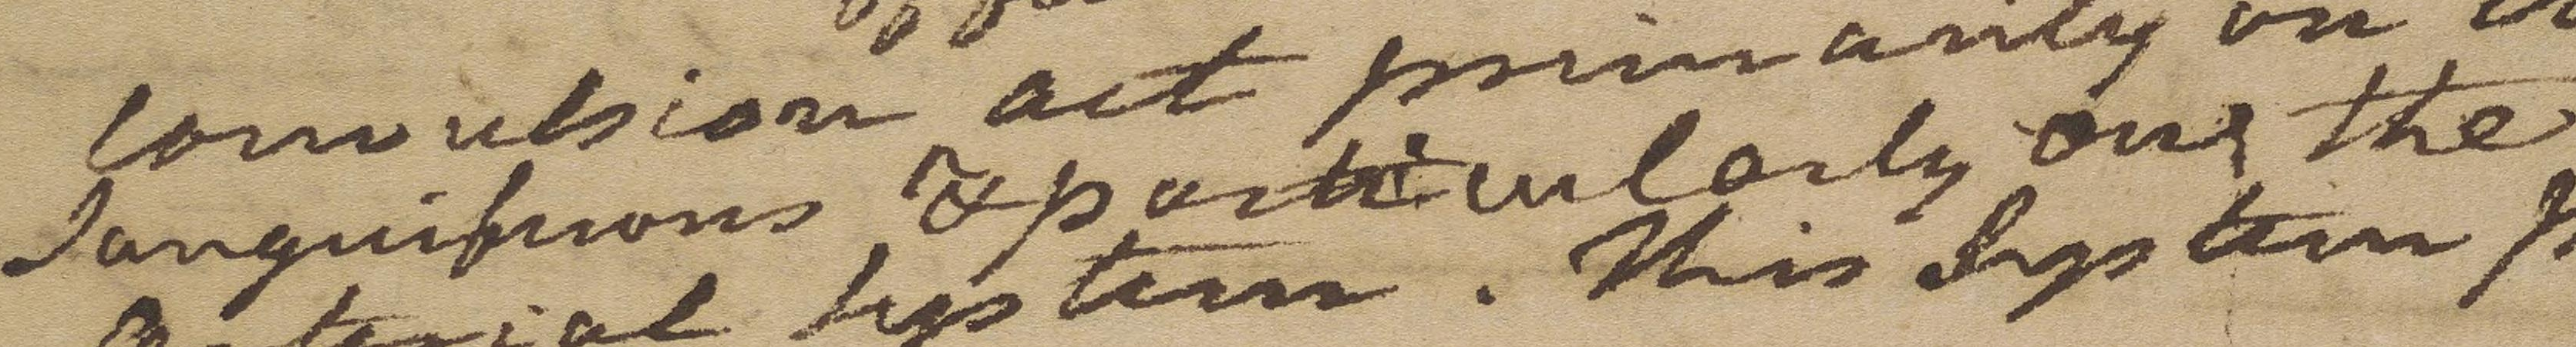sanguiferous & particularly on the
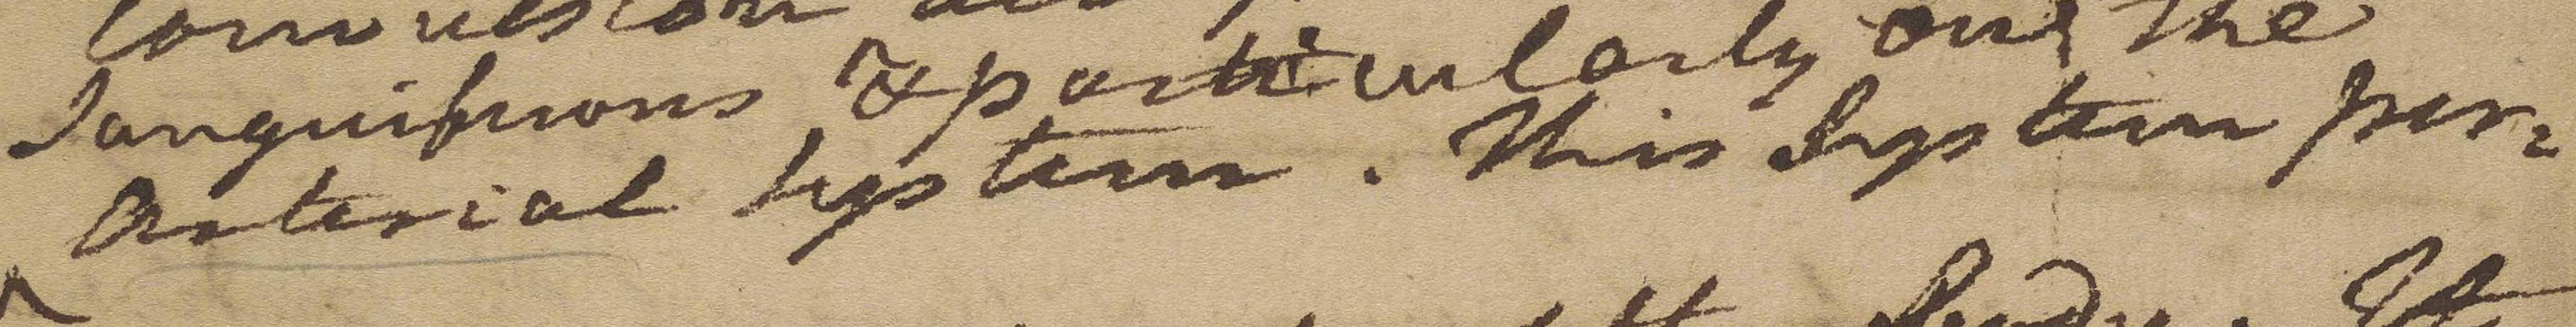^ arterial system. This system per-
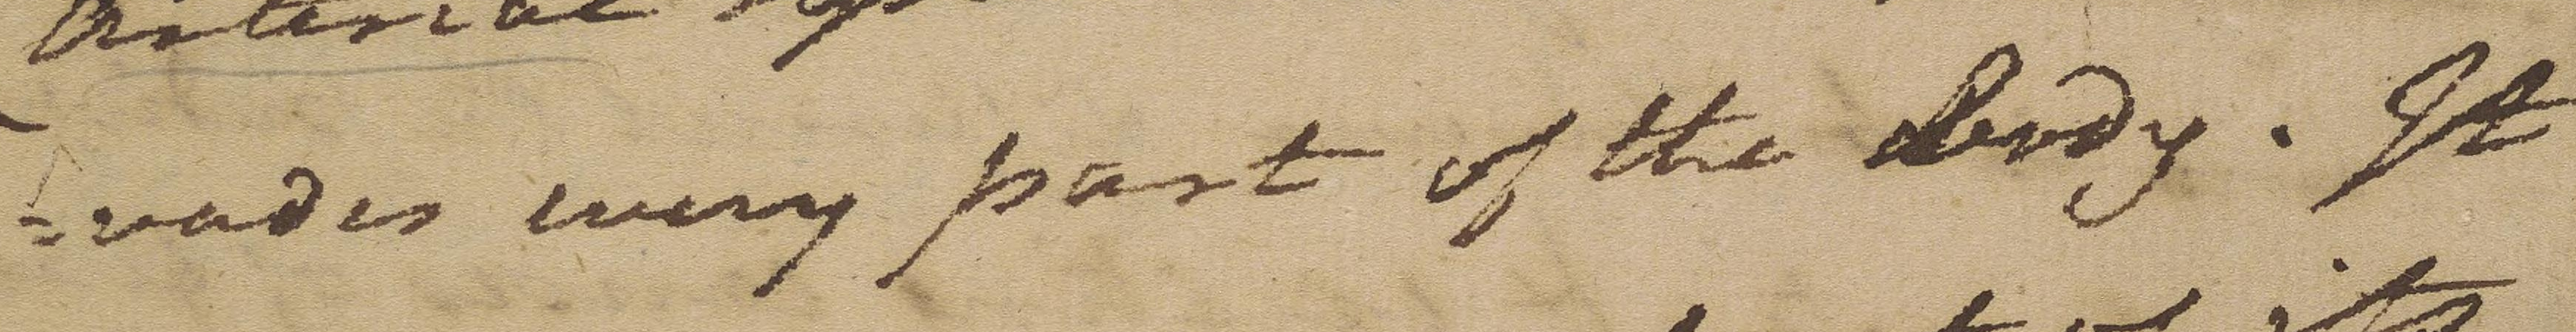suades every part of the body. It
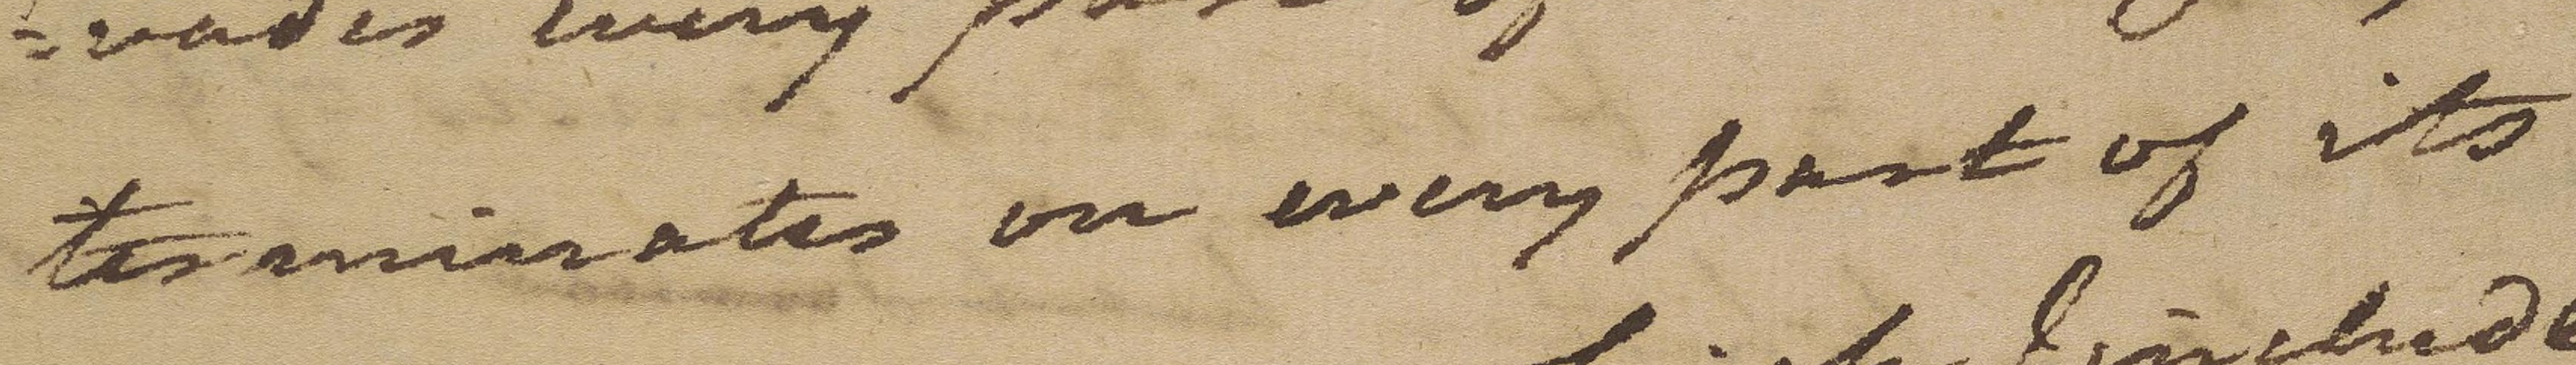terminates on every part of its
